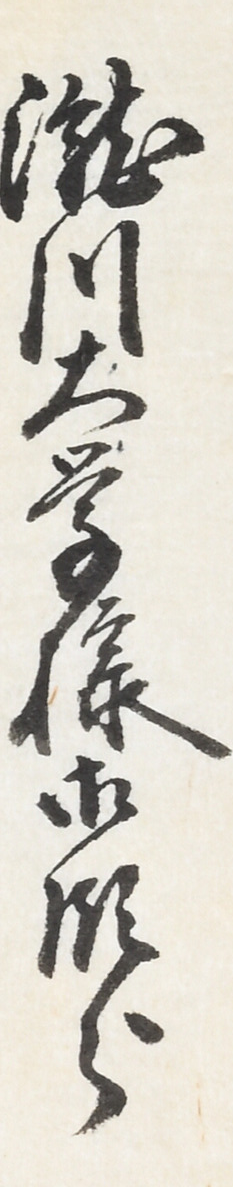瀧川大学様御領分
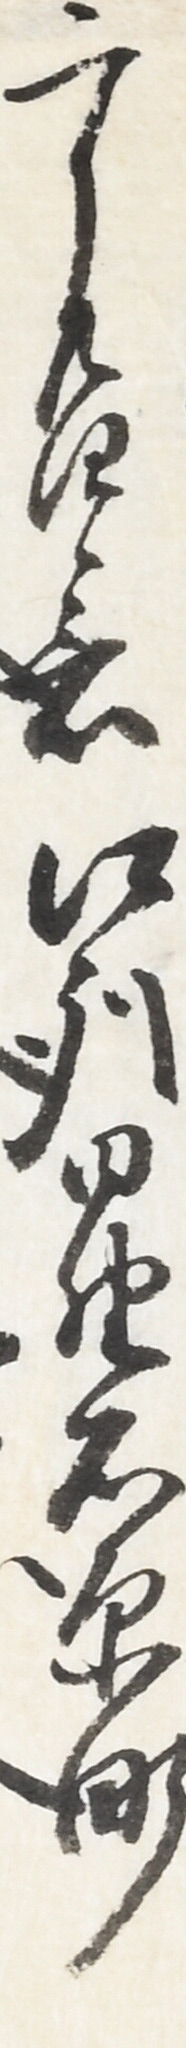弐月廿四日着江州日野石原町
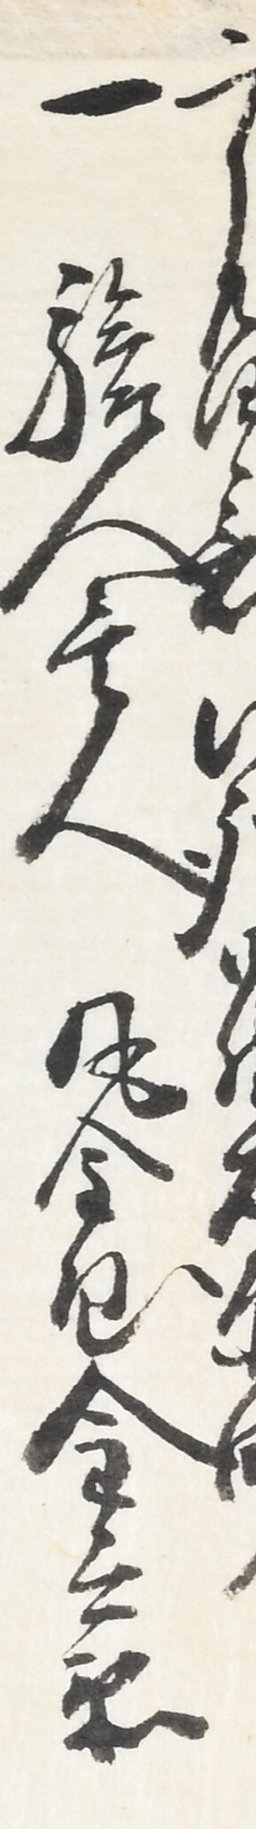一旅人壱人丸金屋金兵衛
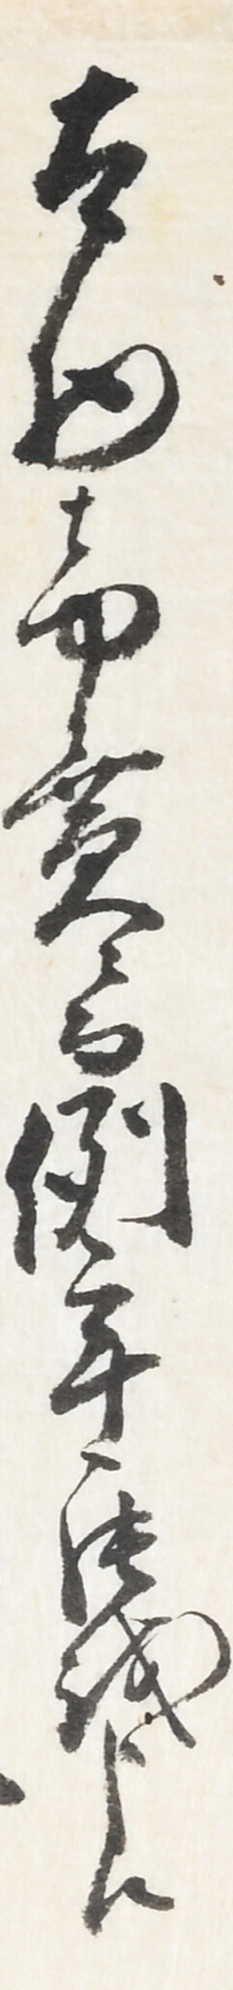太物商売ニ而例年罷越申候
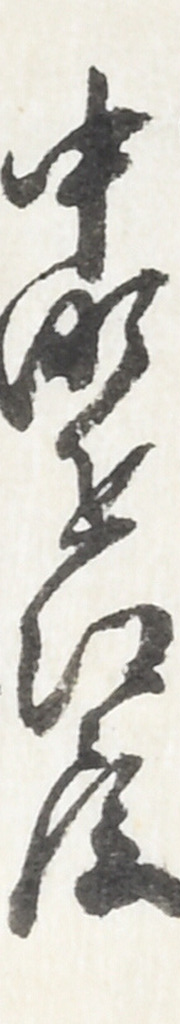中町近江屋
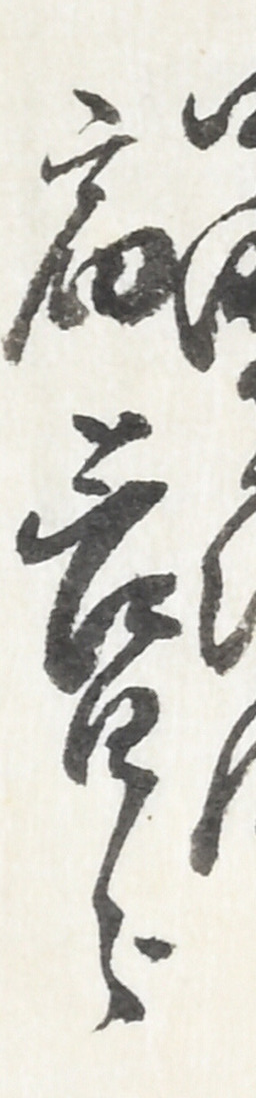宿善四郎
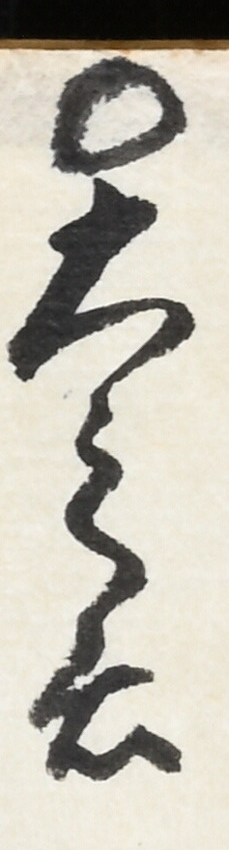〇右之者

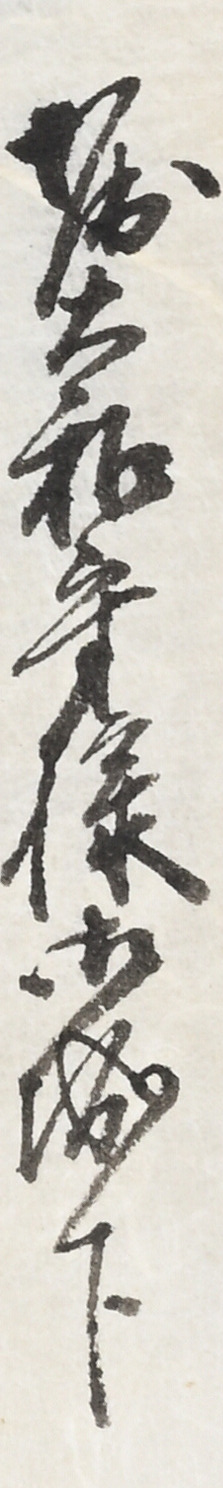堀大和守様御城下
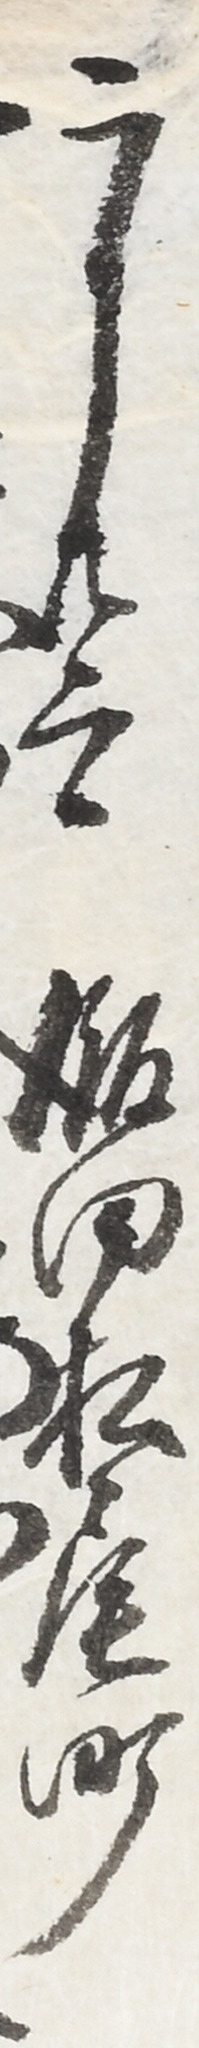二月廿二日飯田松尾町
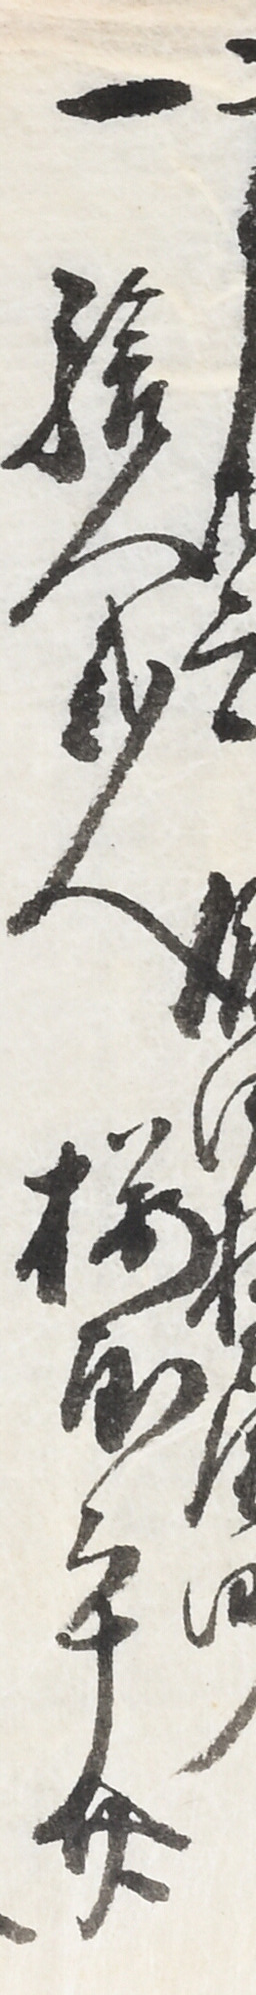一旅人弐人桜屋平介
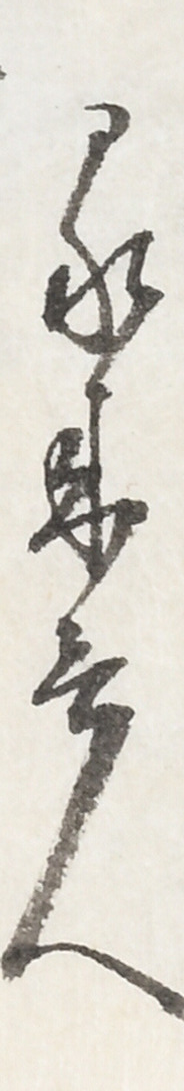家来壱人
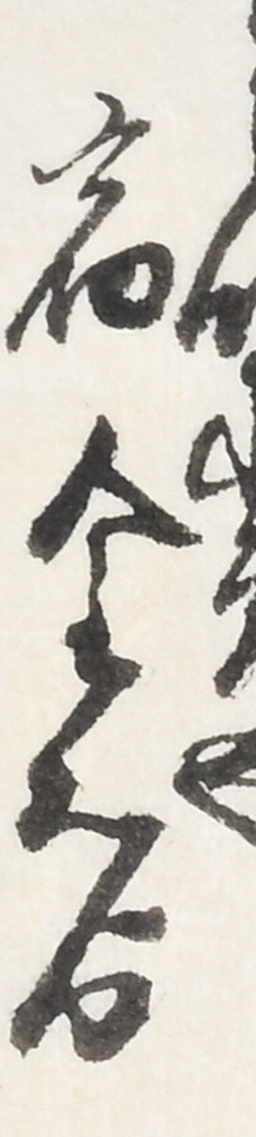宿金右衛門
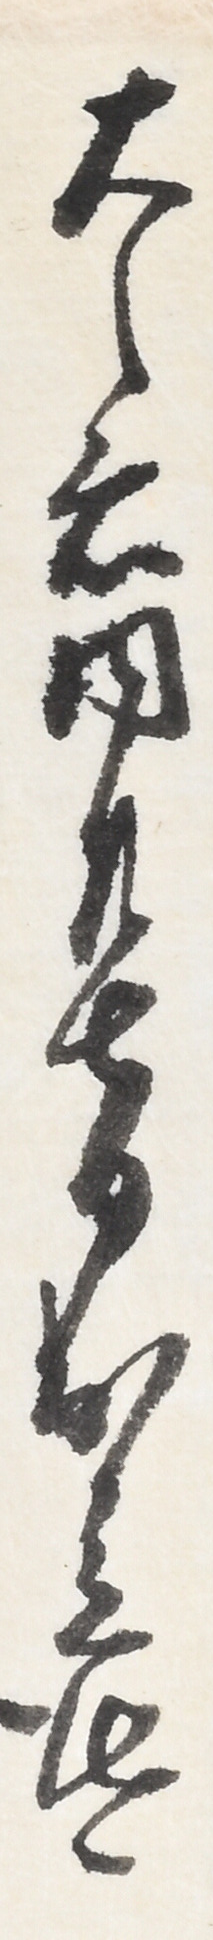右之者同廿七日出立仕候
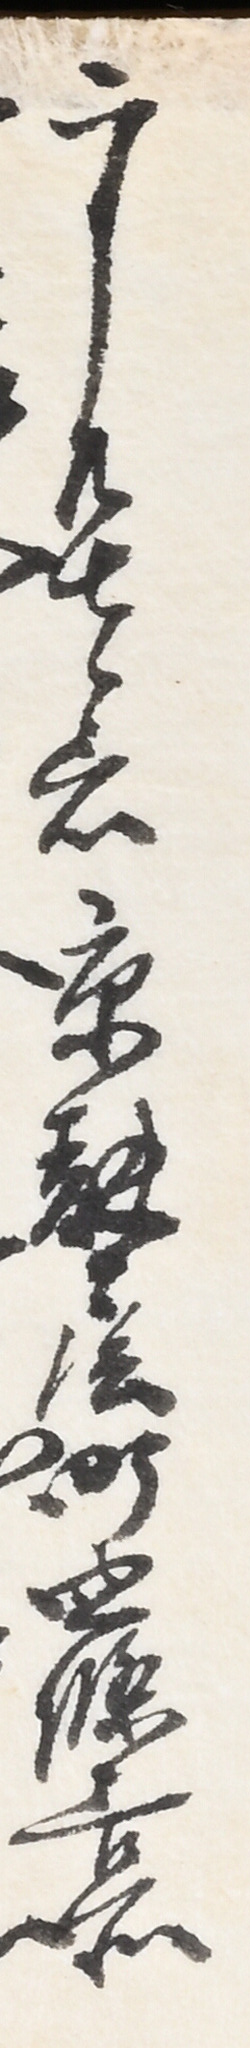二月廿七日着京麩屋町四条上ル所
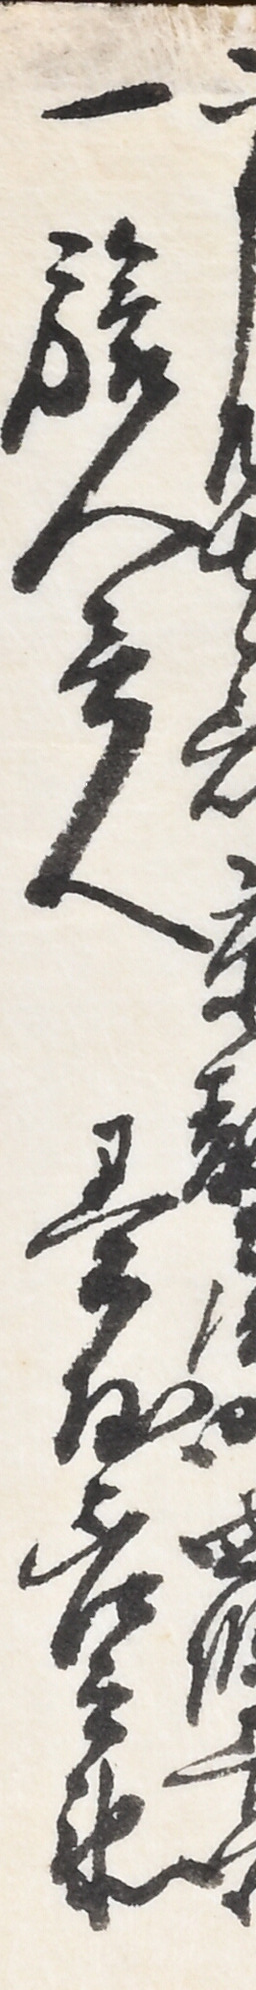一旅人壱人墨屋善兵衛
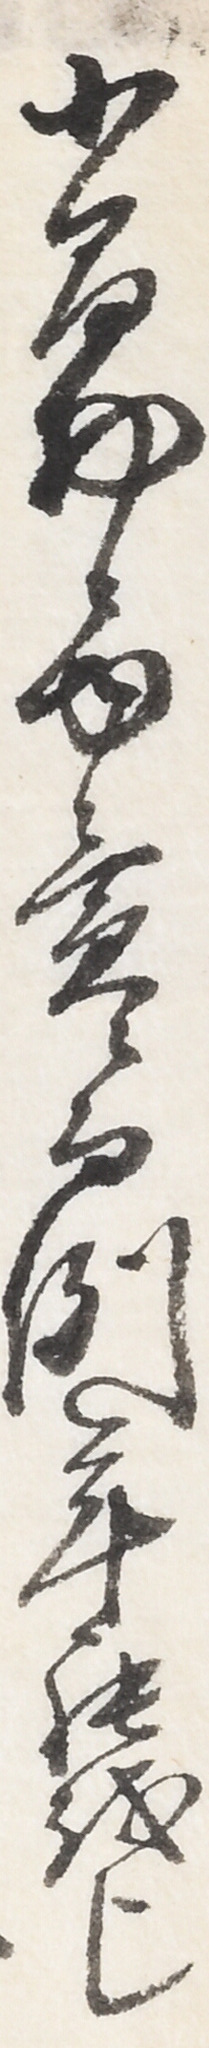小間物商売ニ而例年罷越申候
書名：旅人泊控帳
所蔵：伊那市立高遠町図書館・合同会社AMANE
